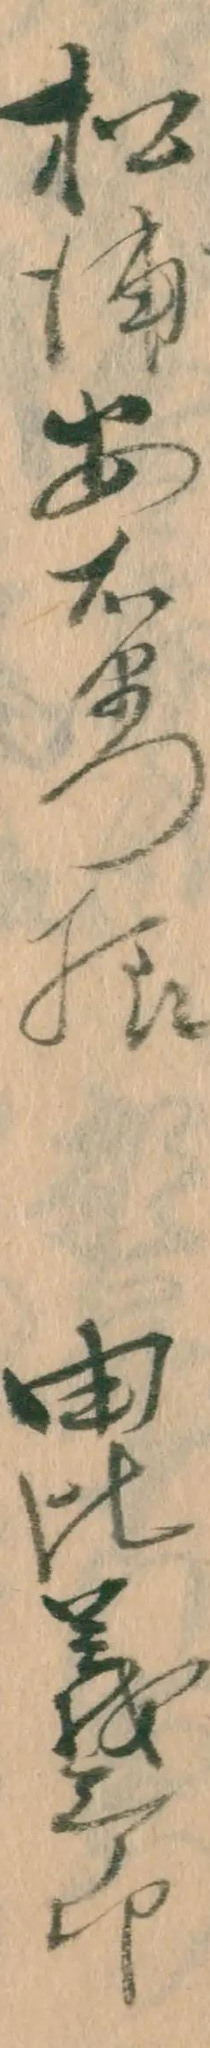松浦安右衛門様由比義三郎
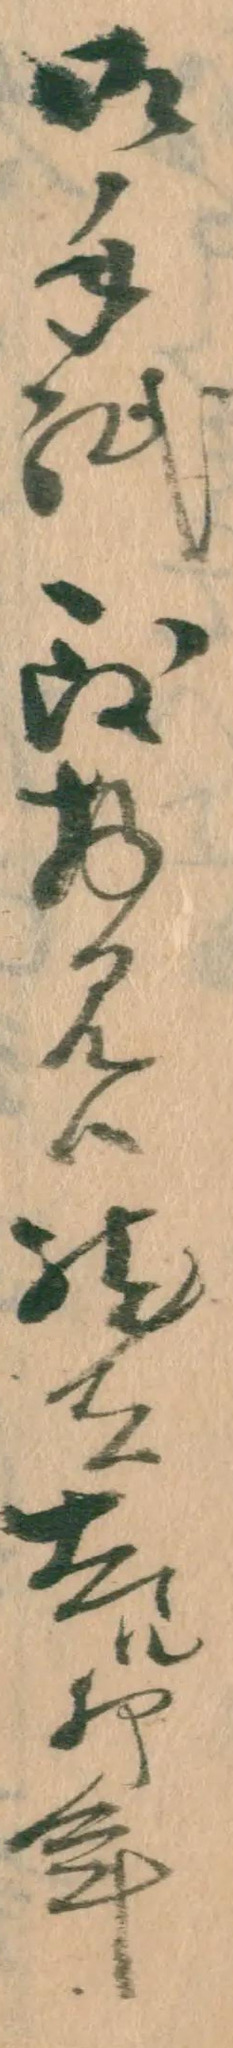御手紙致拝見候然は去ル卯年
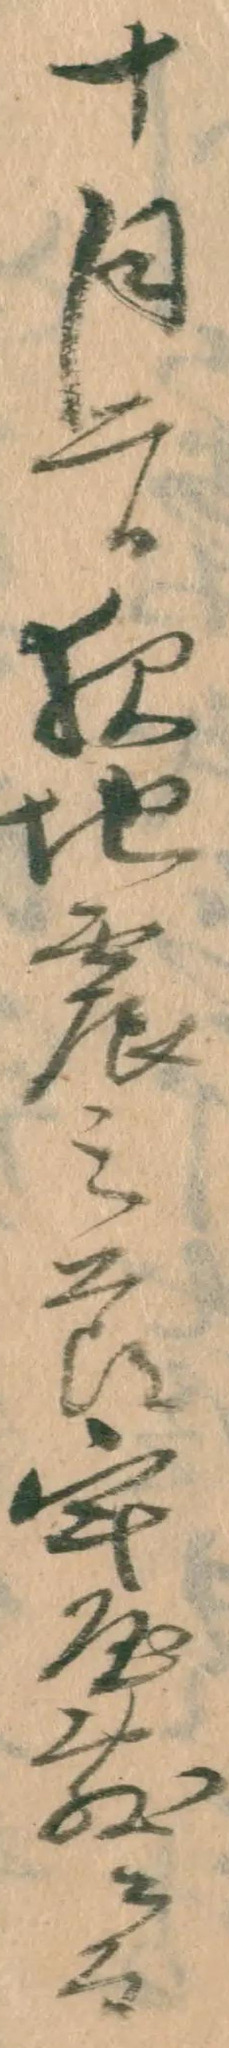十月二日夜地震之節牢屋敷ニて
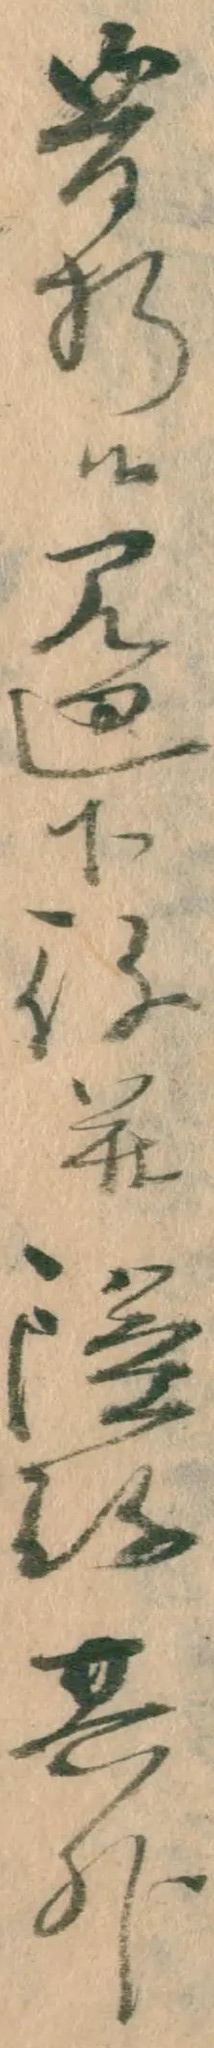骨折候見廻下役幷鎰役其外
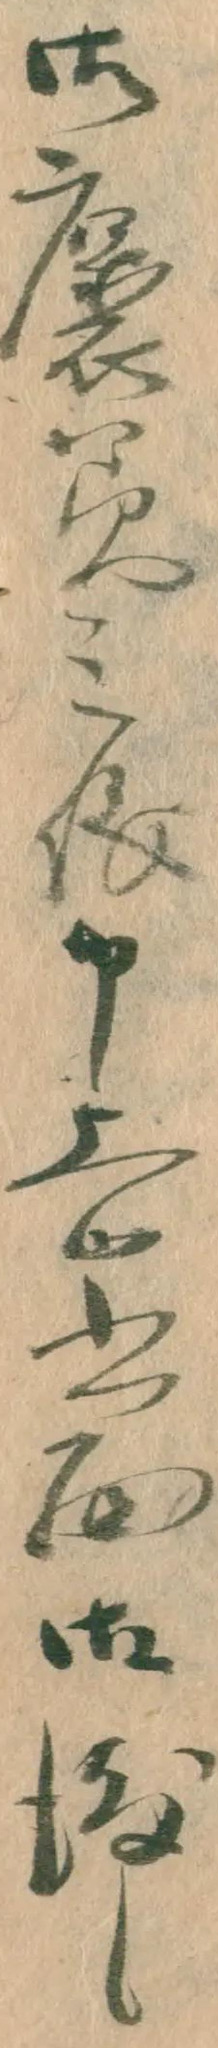御褒美之儀申上候書面御渡し

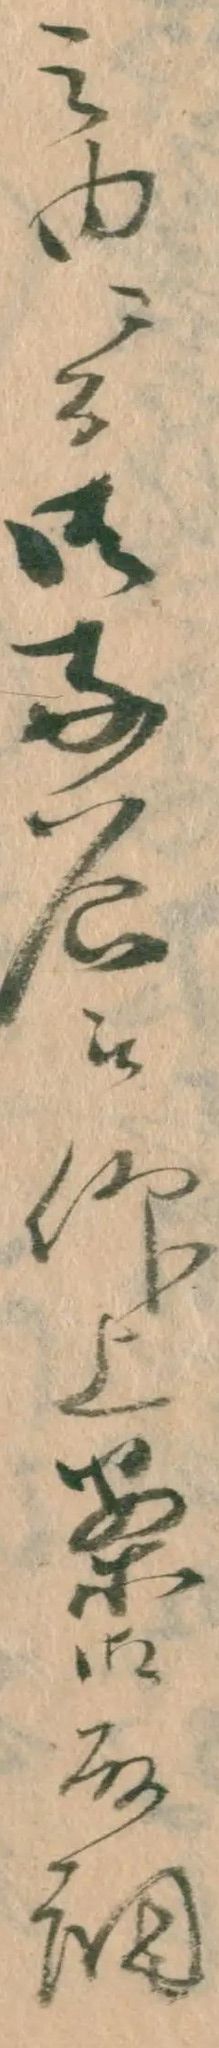之由ニて御当名被仰上案御取調
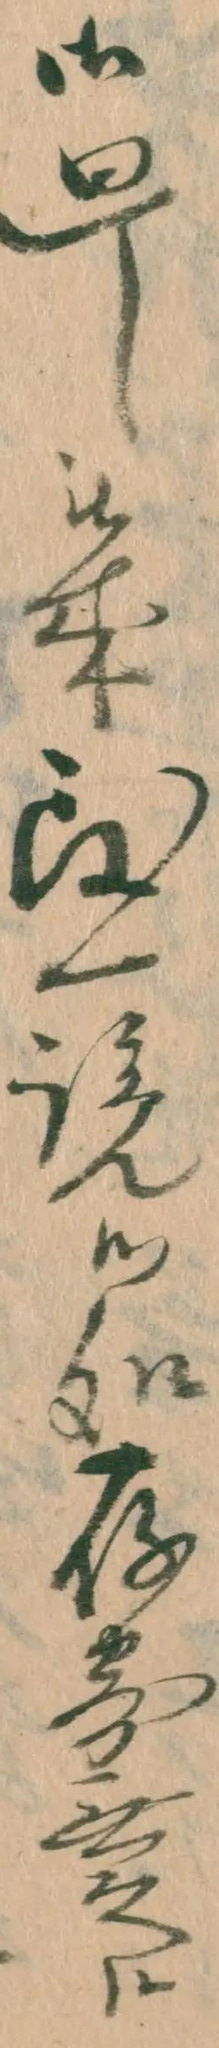御廻し被成致一覧候処存寄無之候
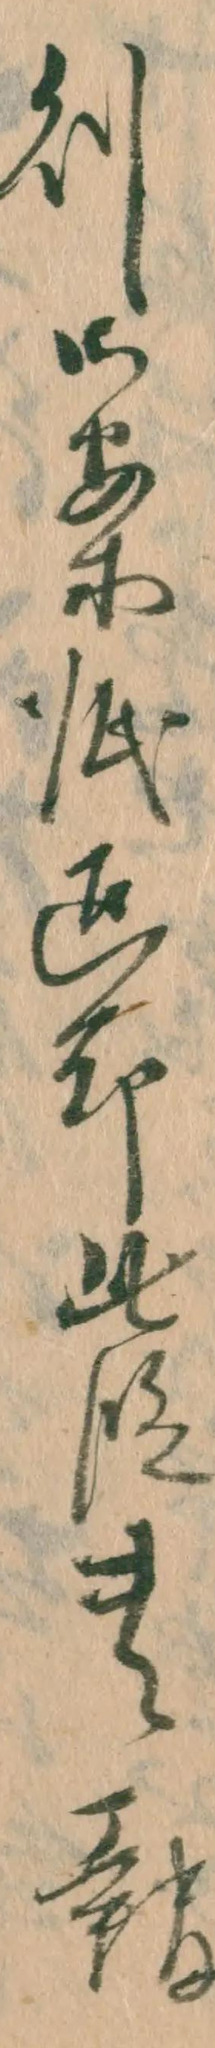則御案紙返却此段貴報
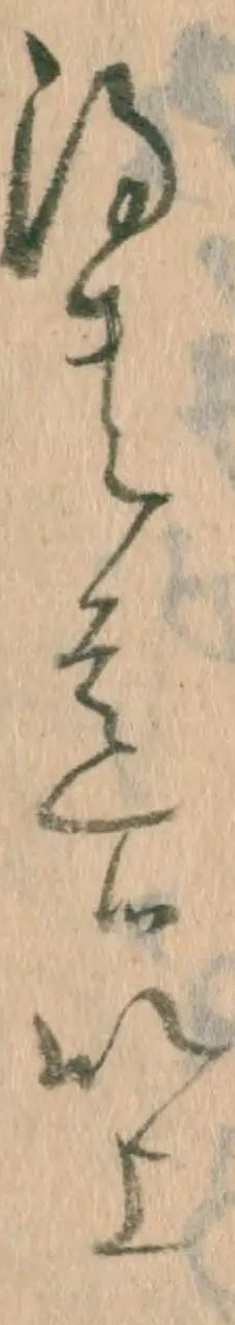得貴意候以上
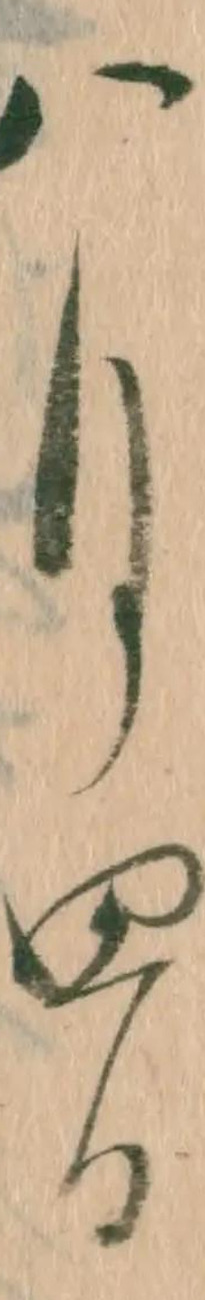八月四日
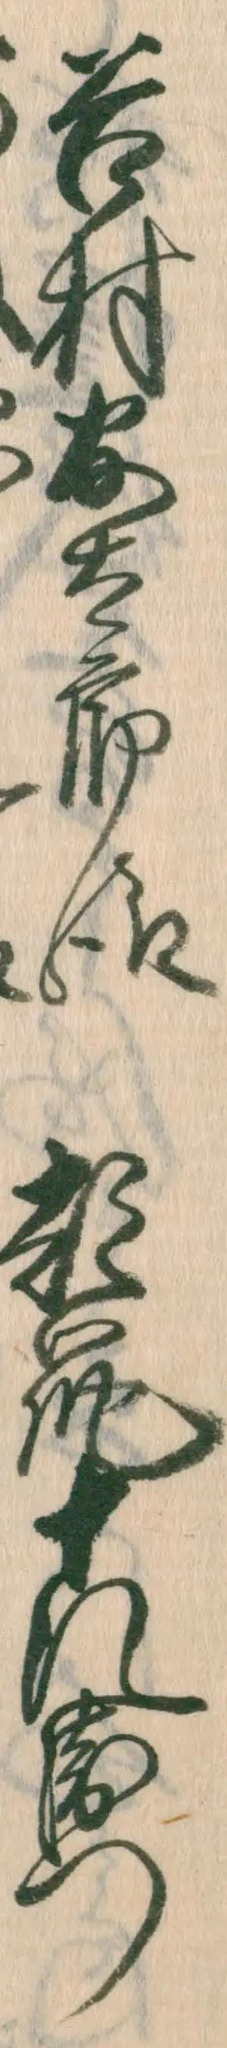│谷村官太郎様都筑十左衛門
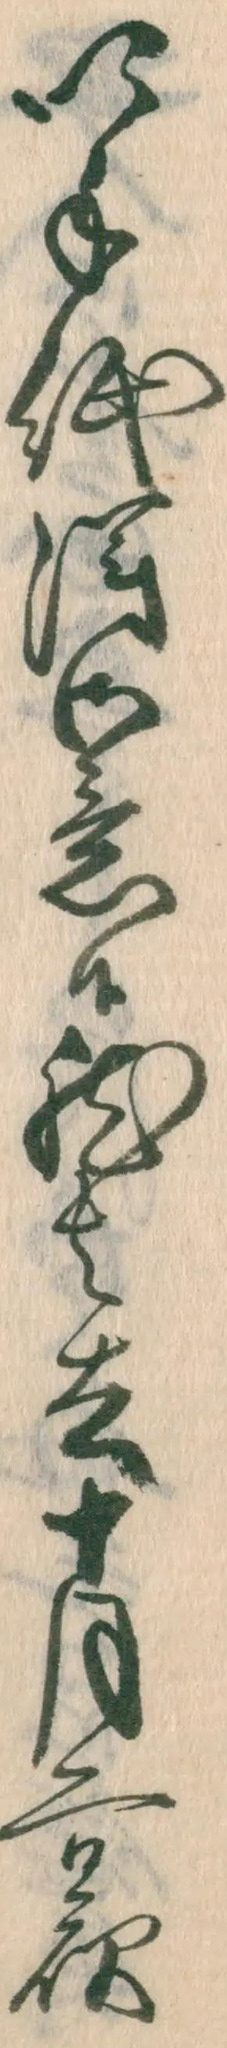以手紙得御意候然は去十月二日夜
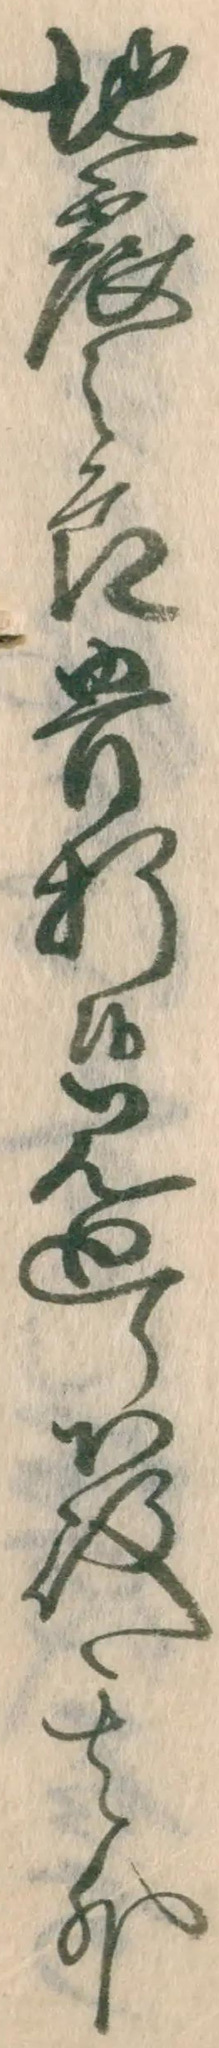地震之節骨折候見廻り下役其外

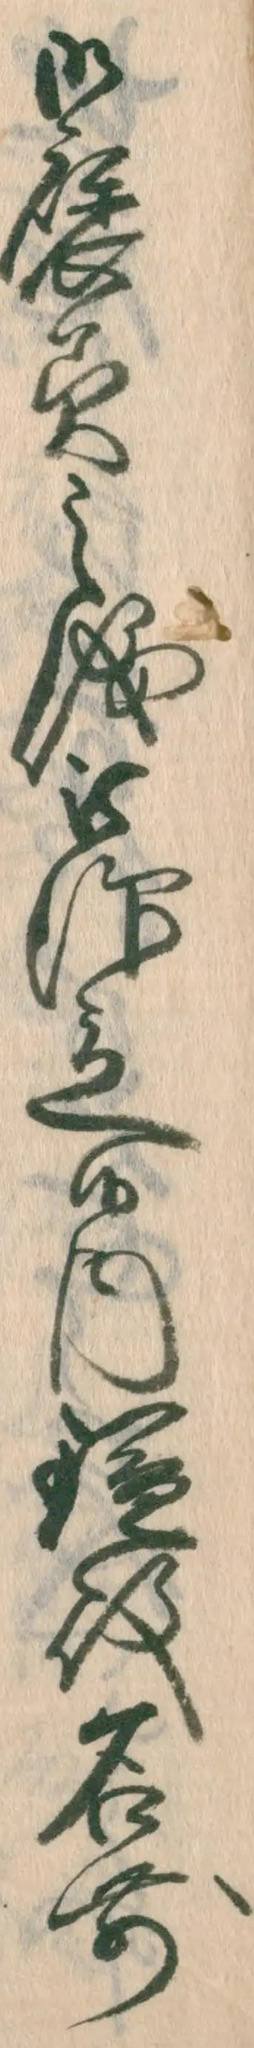御褒美之儀被仰立候内鎰役名前
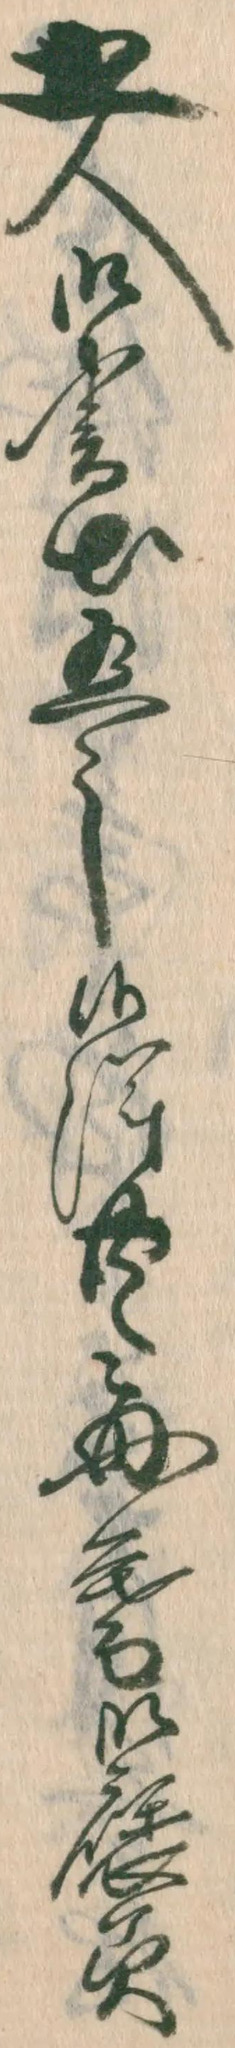五人御書出有之候得共毎暮御褒美
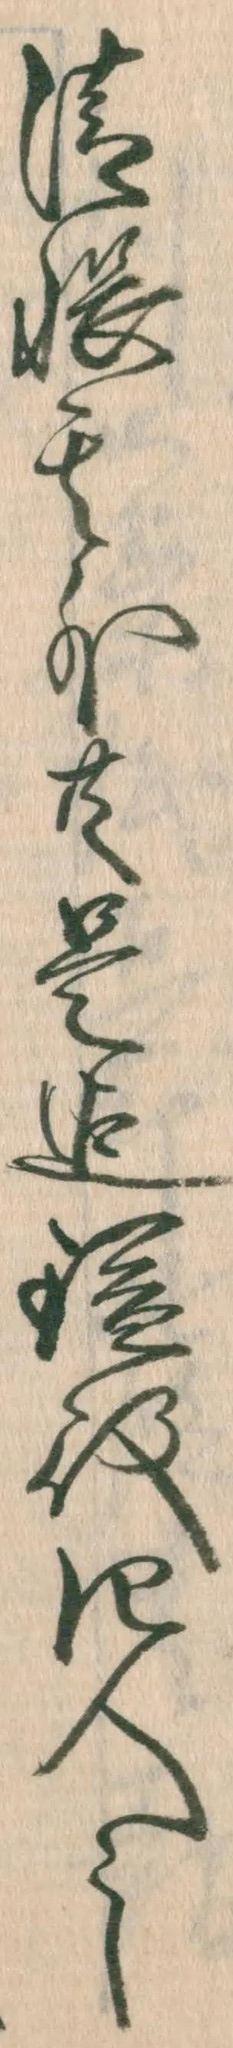請帳其外共是迄鎰役四人之
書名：七十冊物類集 71巻. [44] 四十三 牢屋敷御普請御修覆地震ニ付骨折候牢屋掛御褒美之部
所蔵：国立国会図書館 National Diet Library, JAPAN
